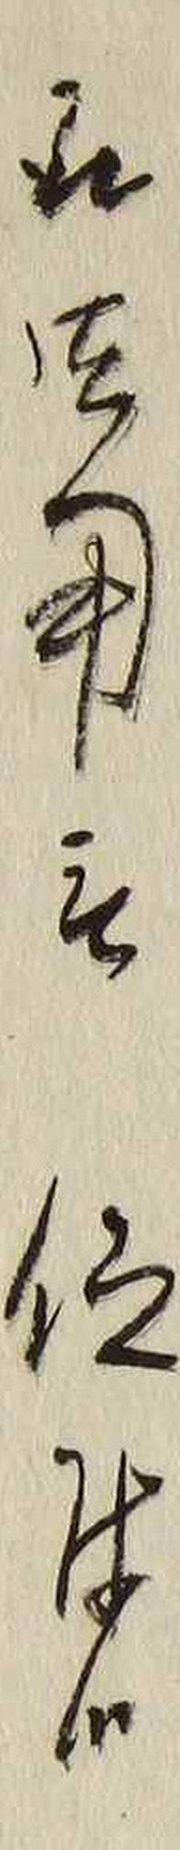取御用被仰付候
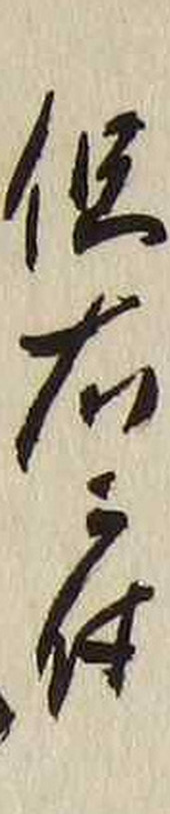但右ニ付
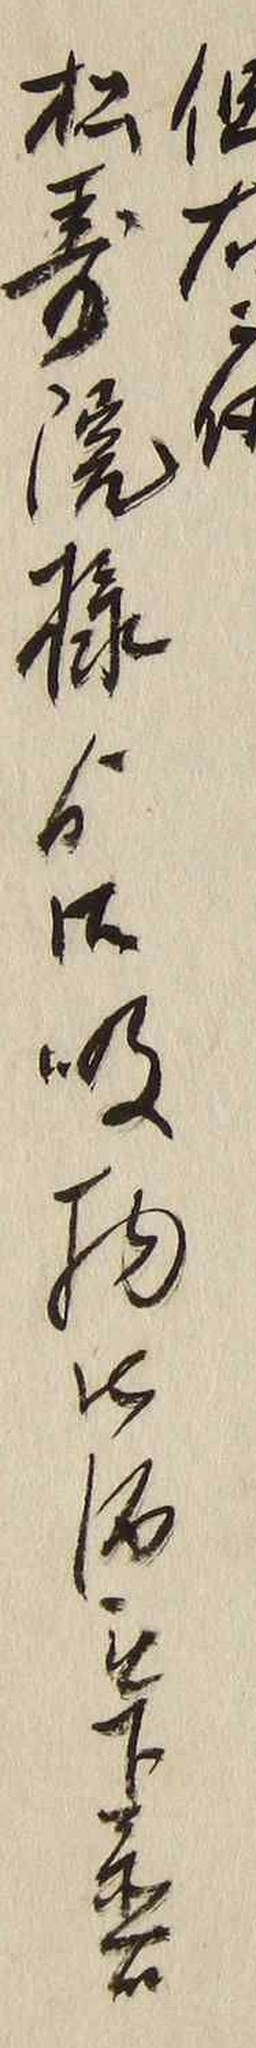松寿院様ゟ御吸物御酒被下置候

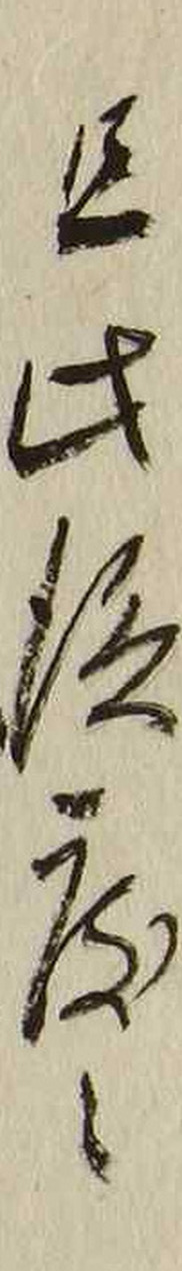且此後度々
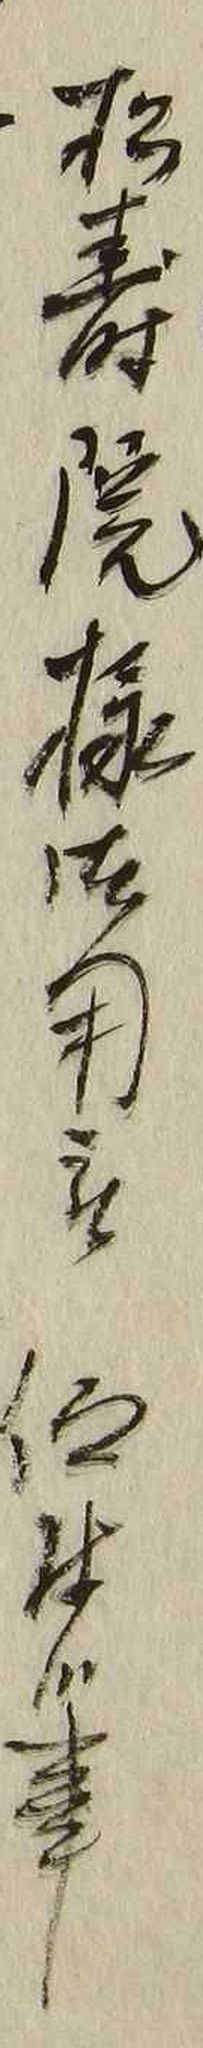松寿院様御用被仰付候事
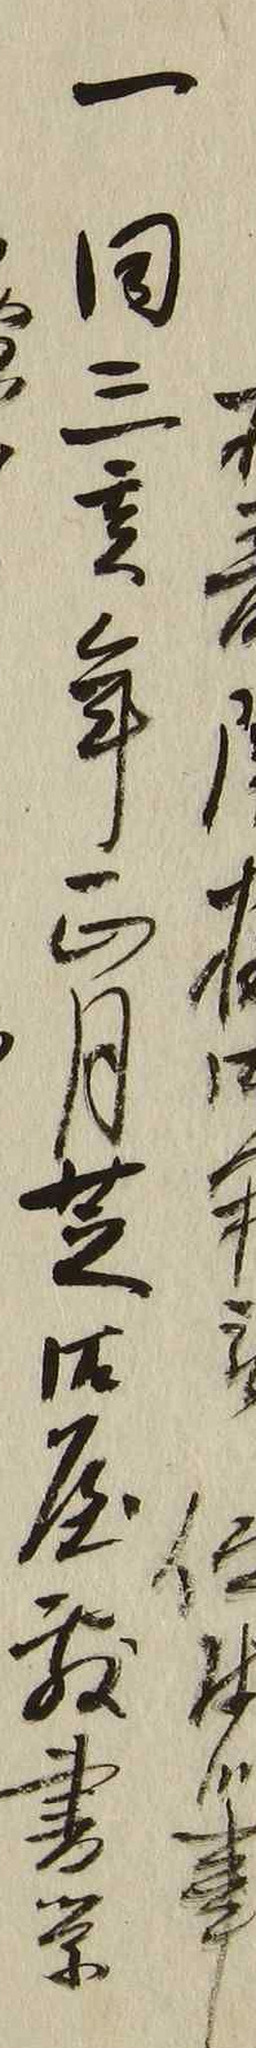一同三亥年正月芝御屋敷書学
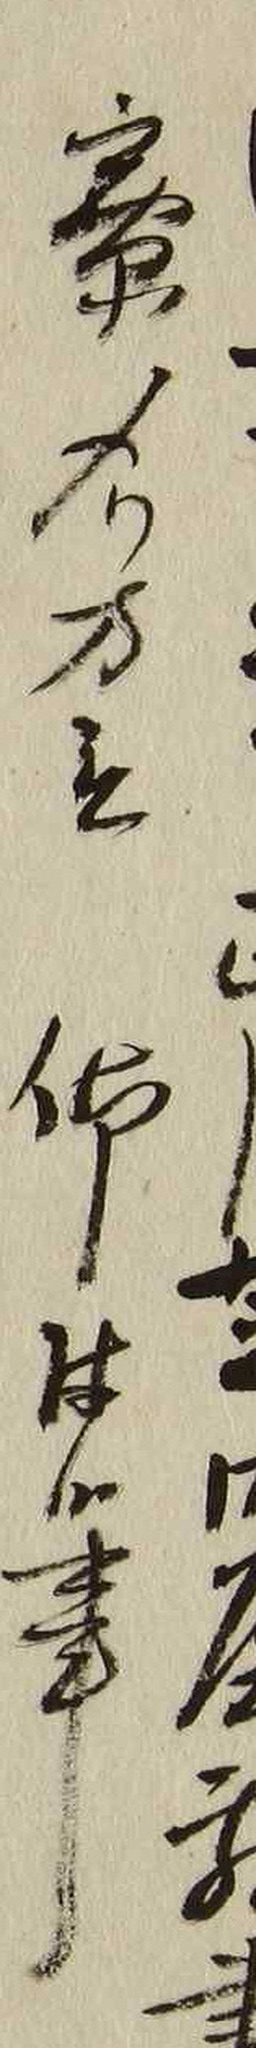寮〆り方被仰付候事
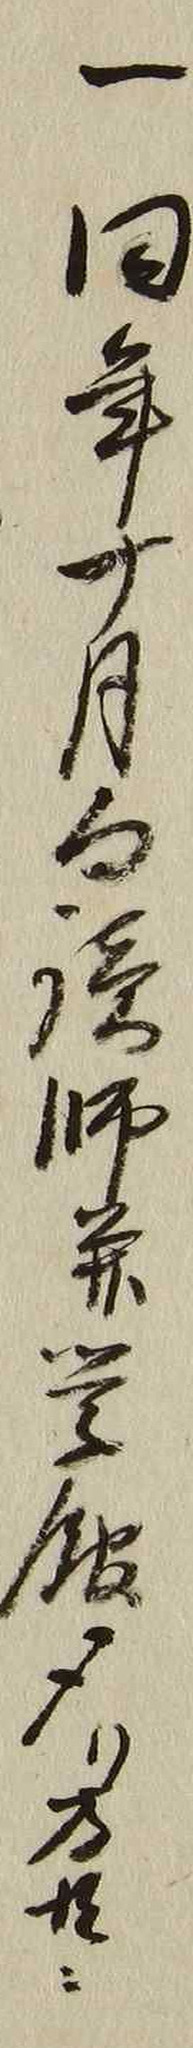一同年十月句読師并学館〆り方共ニ
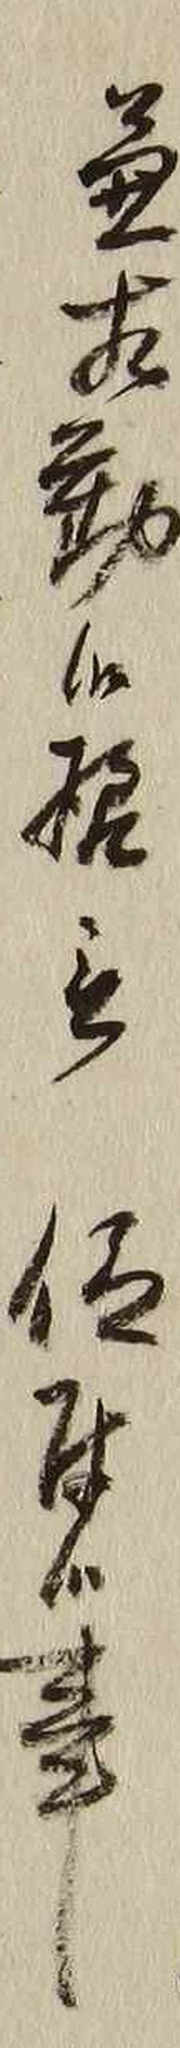兼相勤候様被仰付候事
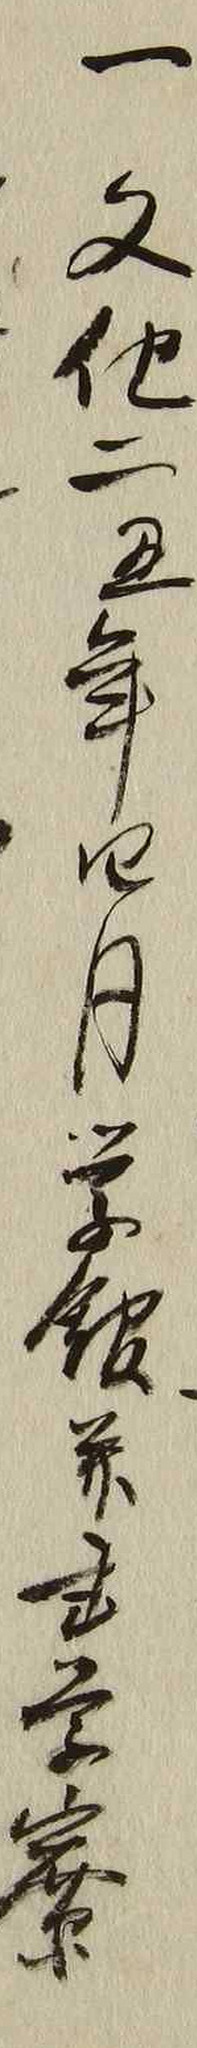一文化二丑年四月学館并書学寮
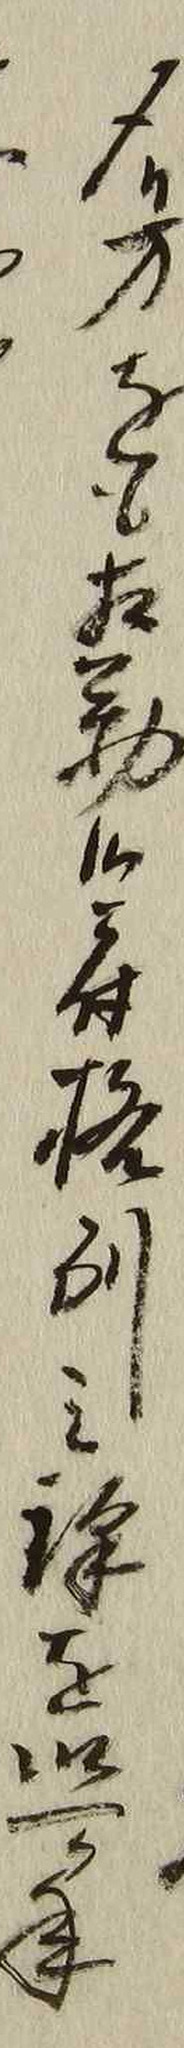〆り方をも相勤候ニ付格別之訳を以一ケ年
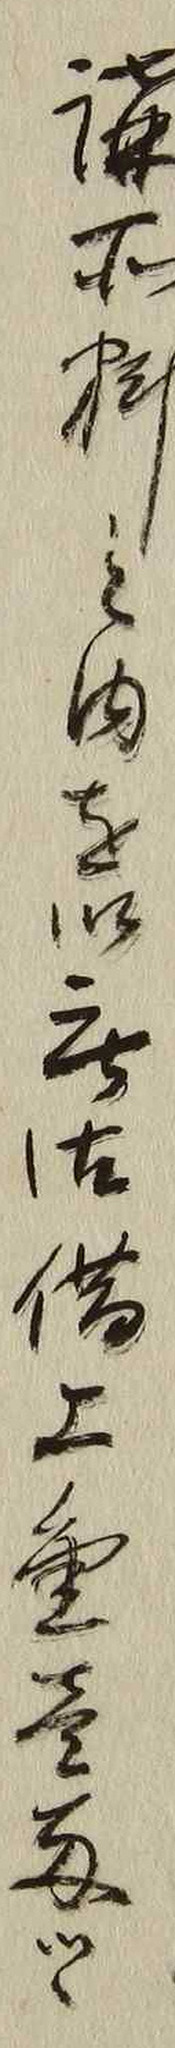講所料之内を以無御借上金両ツヽ
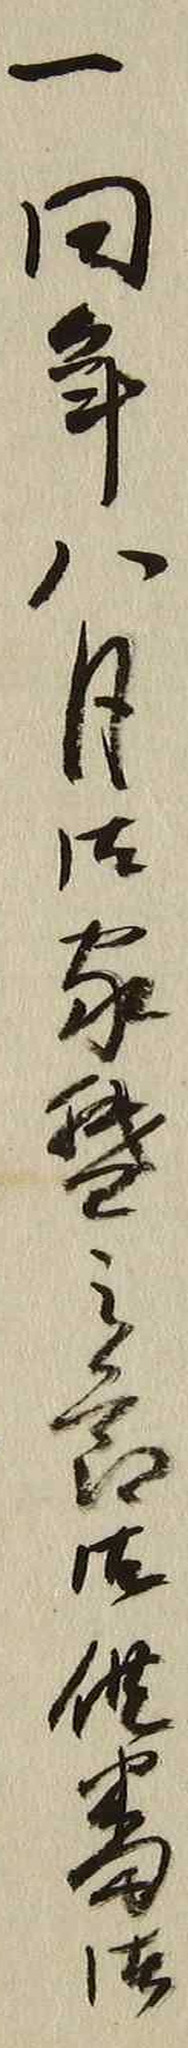一同年八月御家督之節御供番御
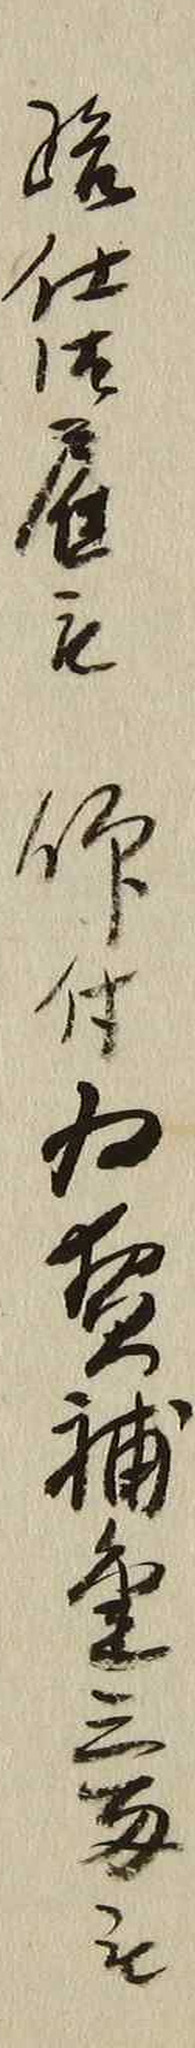給仕御雇被仰付為費補金三両被
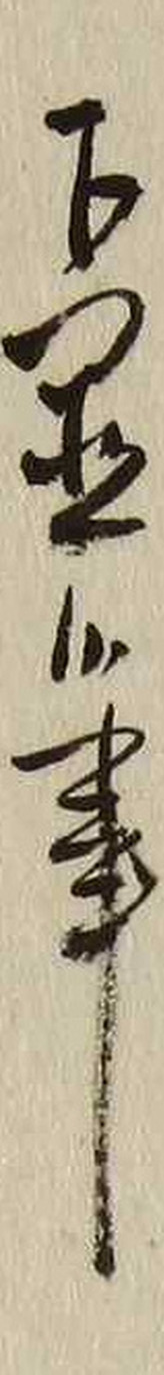下置候事
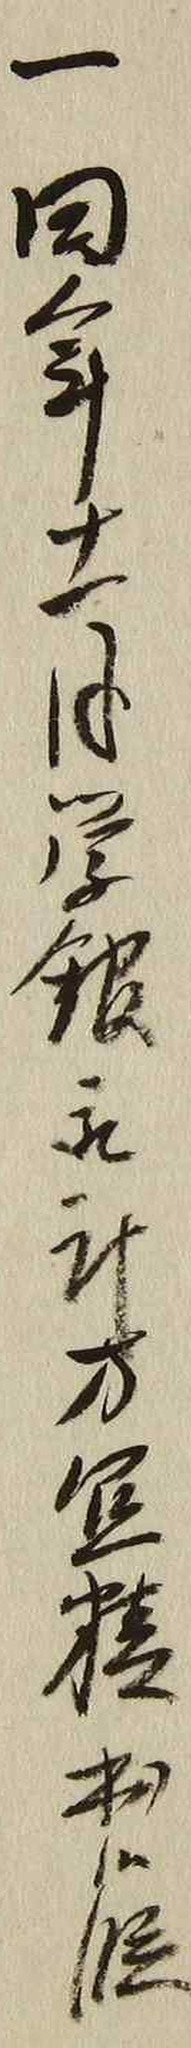一同年十一月学館取計方宜精出候段
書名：諸士系譜　巻之349　も之部5
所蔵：会津若松市立会津図書館
